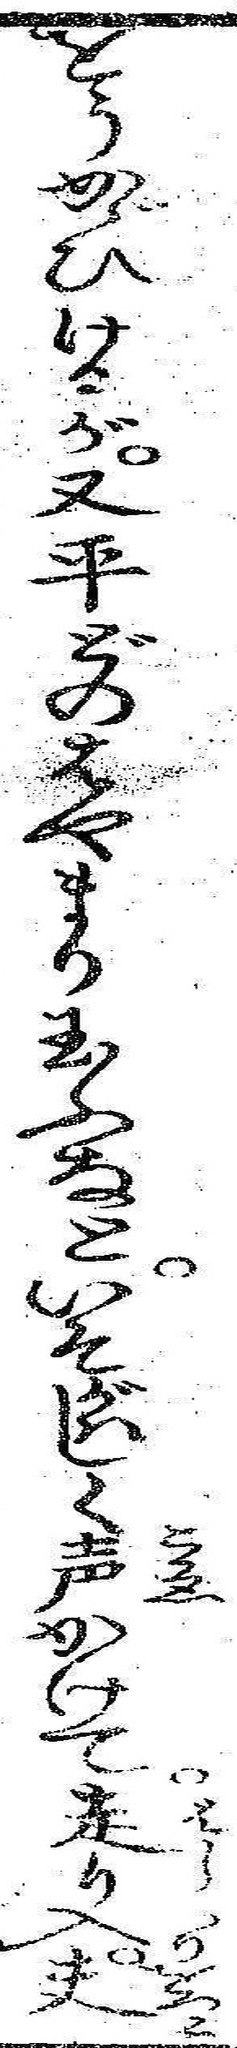をうかゞひけるが。又平どのはやまり玉ふなと。いそがしはく声かけて。走り入。夫
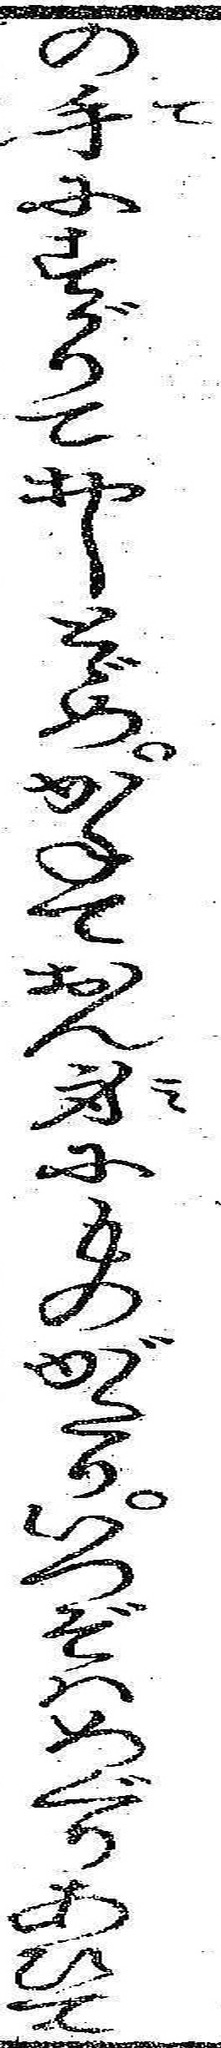の手にすがりておしとゞめ。かねておん身にものがたり。いつぞはめぐりあひて
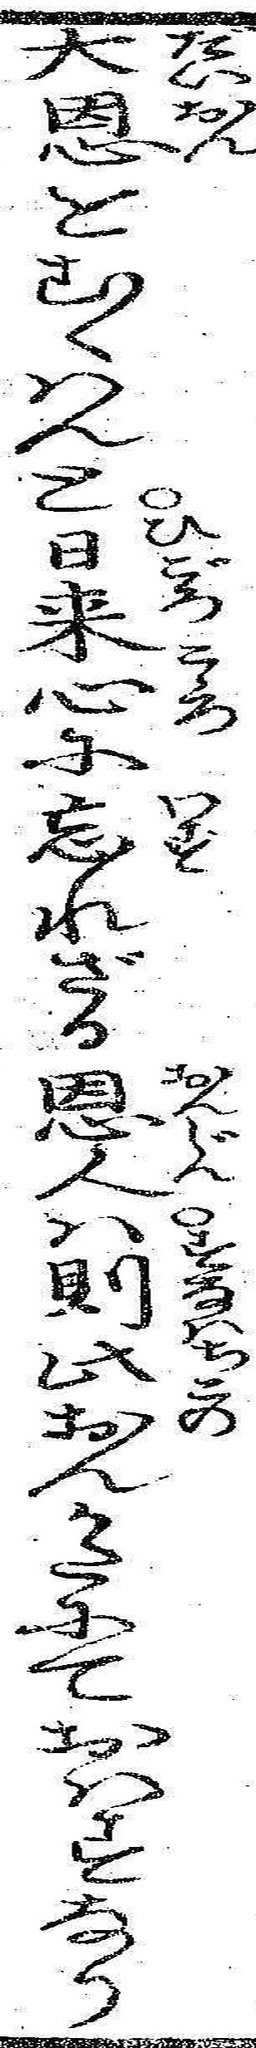大恩をむくはんと。日来心に忘れざる恩人は。則此おんかたにておはすなり
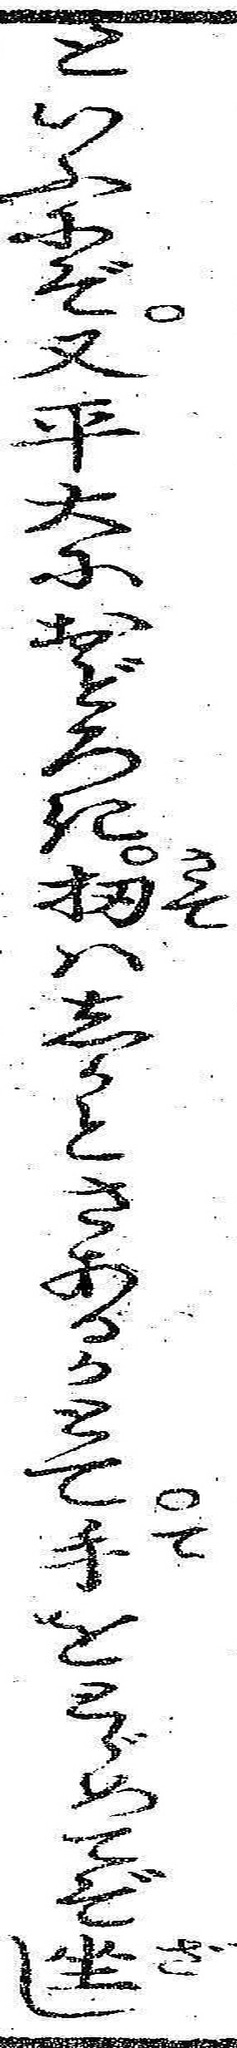といふにぞ。又平大におどろき。扨はしかとさあるかとて。手をとゞめてぞ坐し
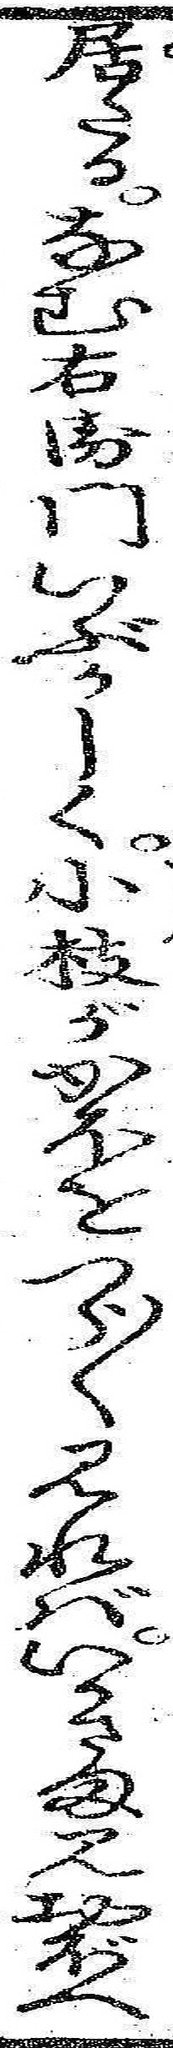居たる。なむ右衛門いぶかしく。小枝がかほをつら〳〵見れば。いかさま見おぼへ
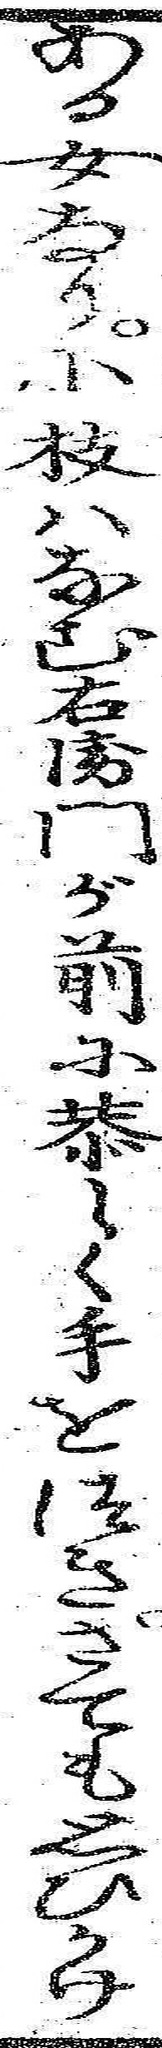ある女なり。小枝はなむ右衛門が前に恭しく手をつき。さても思ひかけ
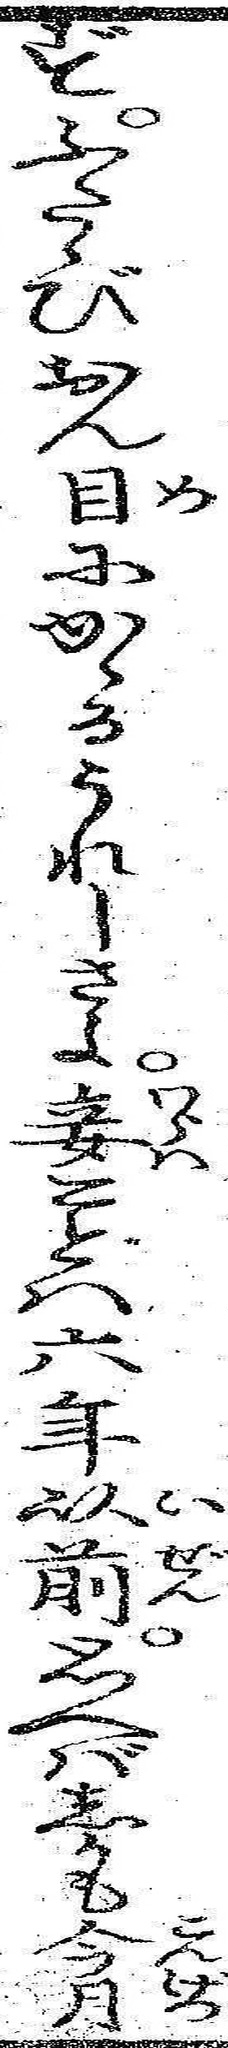ず。ふたゝびおん目にかゝるうれしさよ。妾ことは六年以前。思へばしかも今月
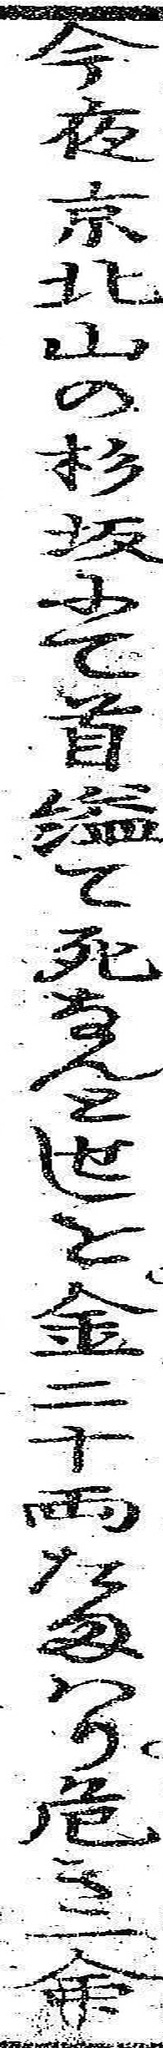今夜。京北山の杉坂にて。首縊て死なんとせしを。金二十両たまはり。危き一命
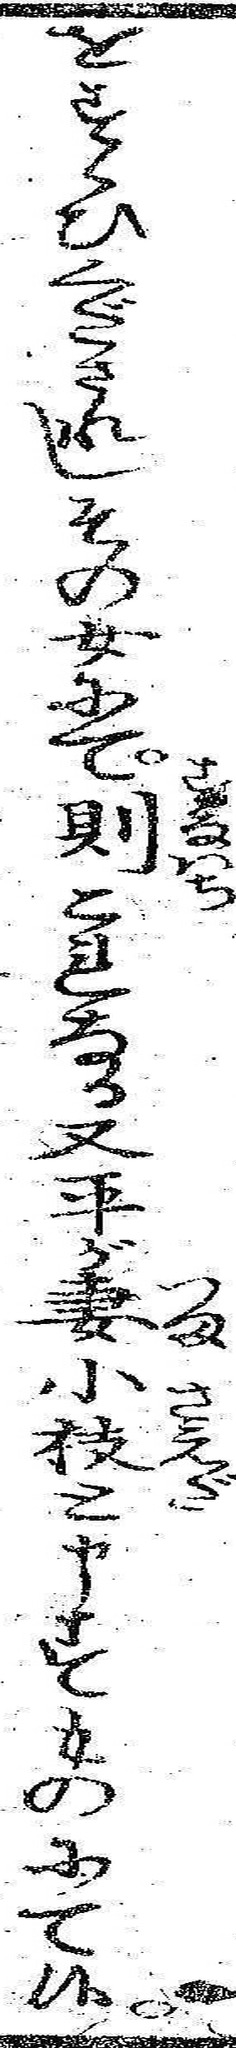をすくひくだされしその女にて。則これなる又平が妻小枝と申すものにて候。

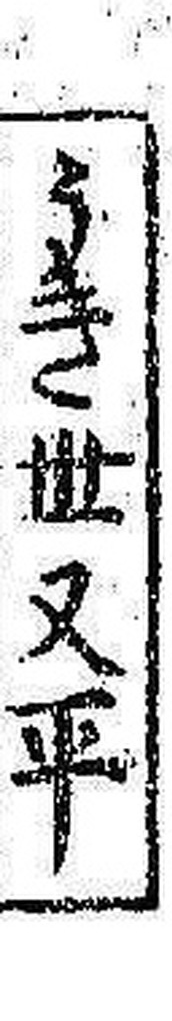うき世又平
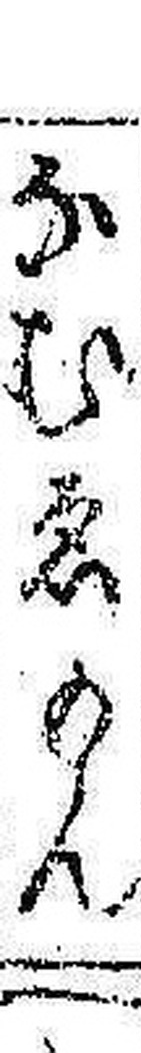なむゑもん
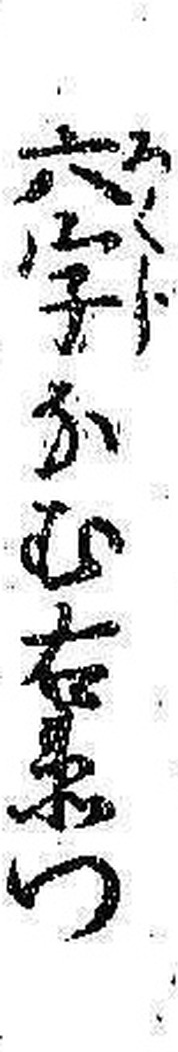六字なむ右衛門
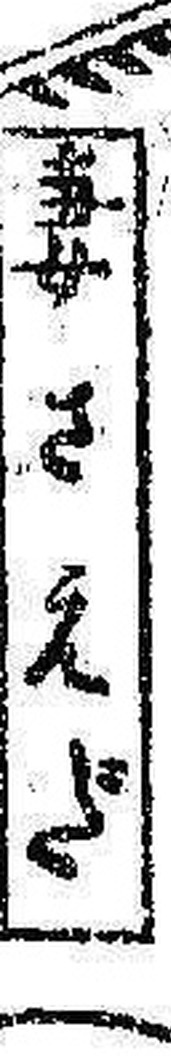妻さえだ
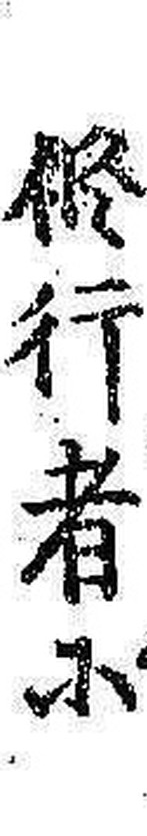修行者に
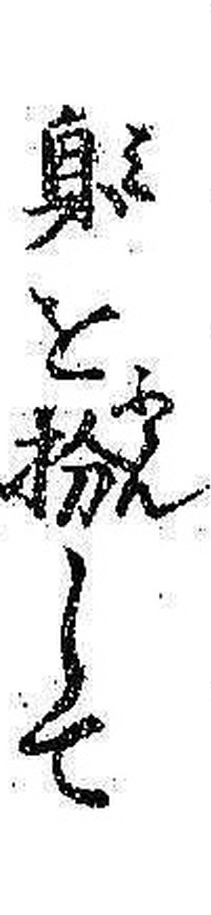身を扮して
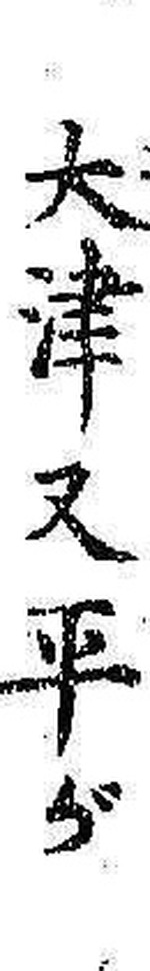大津又平が
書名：昔話稲妻表紙
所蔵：国文学研究資料館
